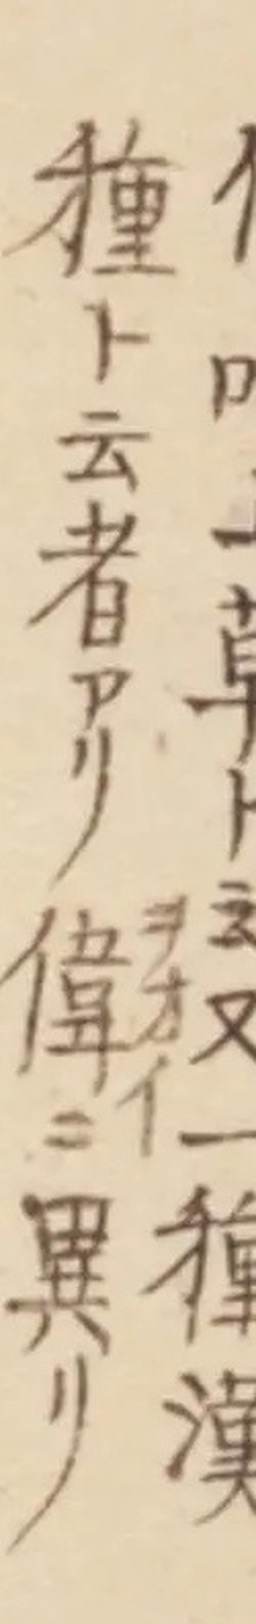種ト云者アリ違ニ異リ

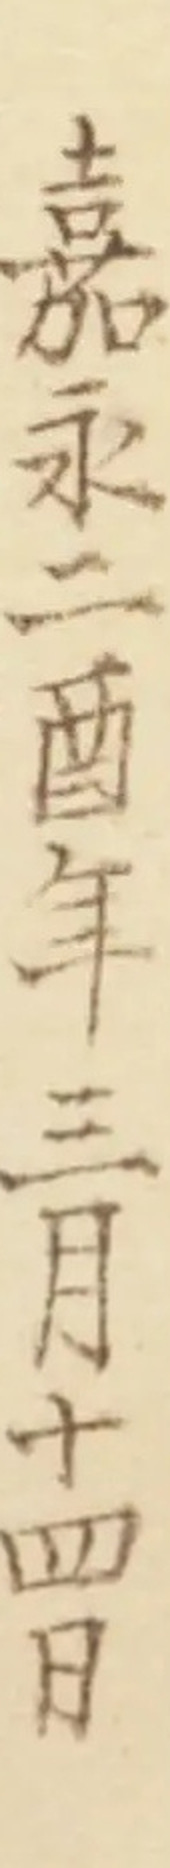嘉永二酉年三月十四日
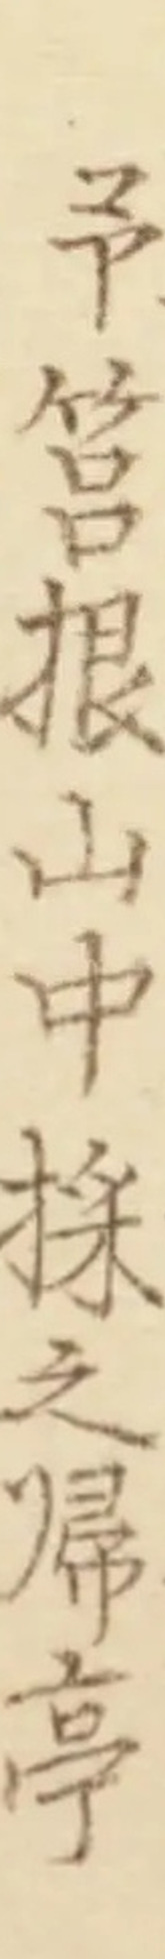予箱根山中採之帰亭
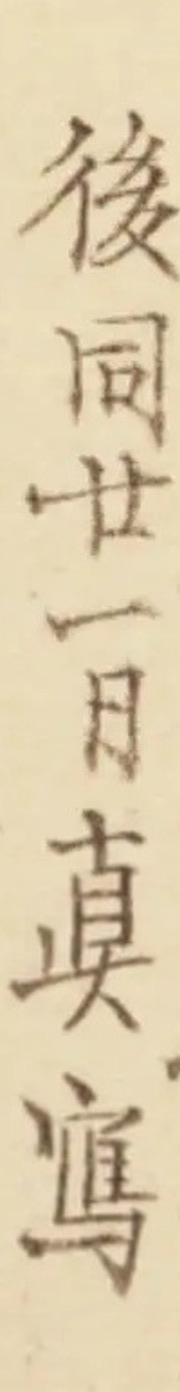後同廿一日真写

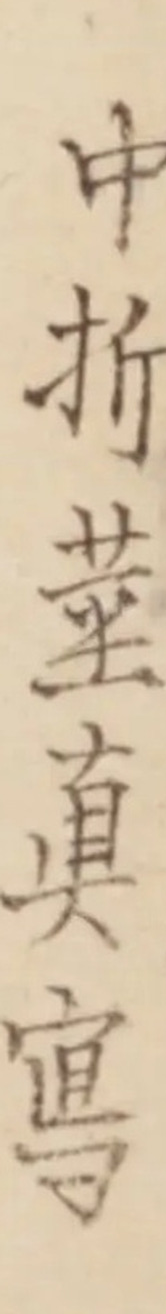中折茎真写
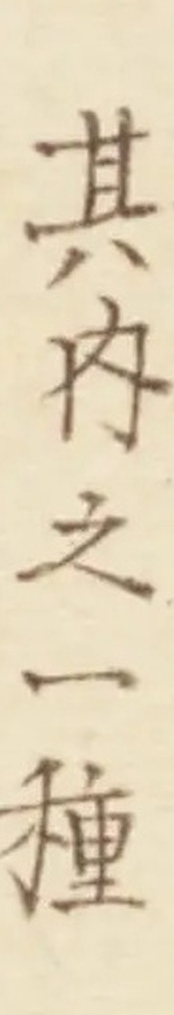其内之一種
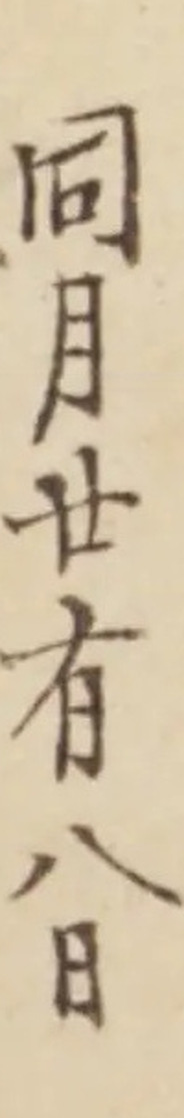同月廿有八日
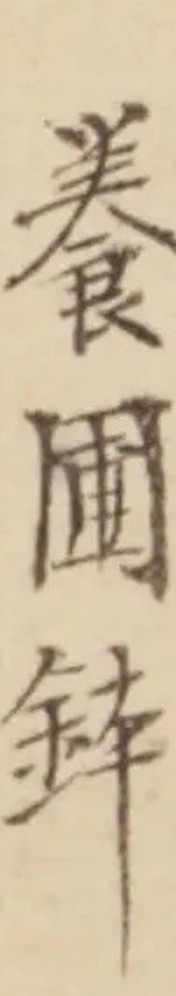養圃鉢

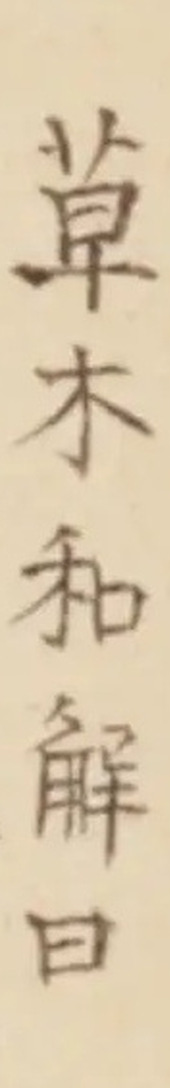草木和解曰
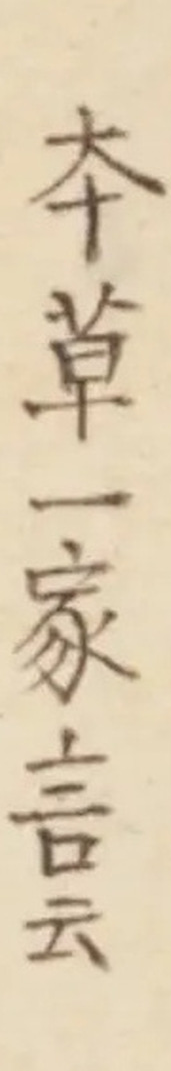本草一家言云
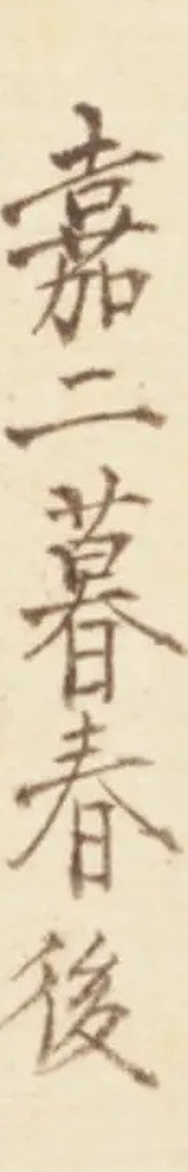嘉二暮春後
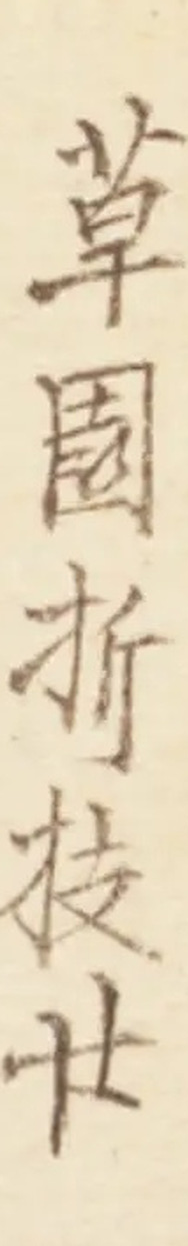草園折枝廿
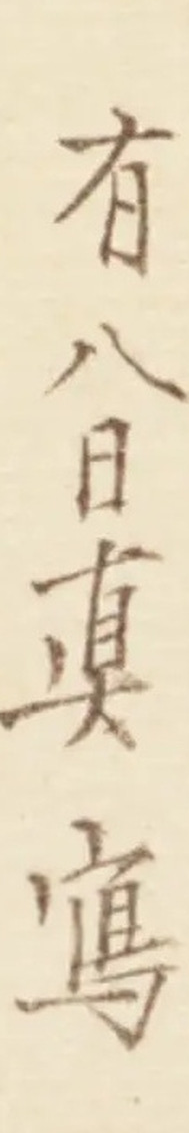有八日真写
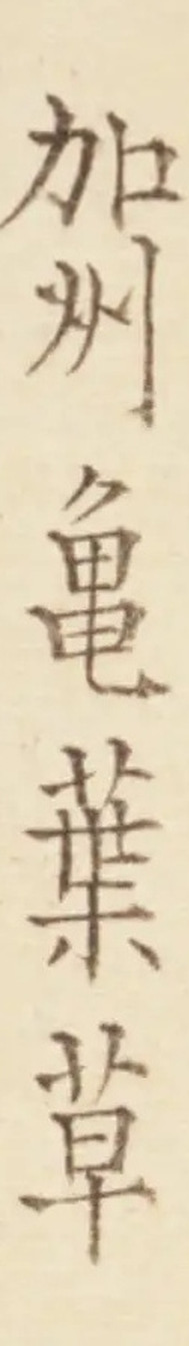加州亀葉草
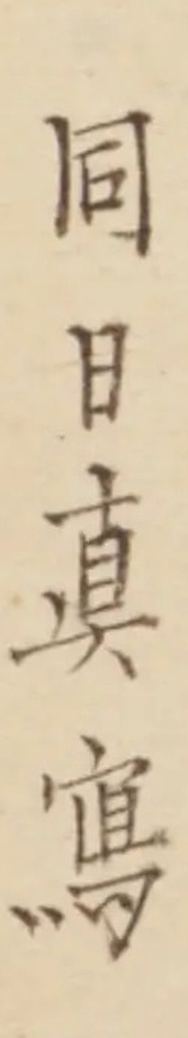同日真写

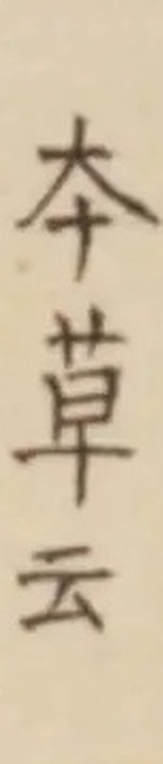本草云
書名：梅園草木花譜冬之部
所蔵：国立国会図書館 National Diet Library, JAPAN
